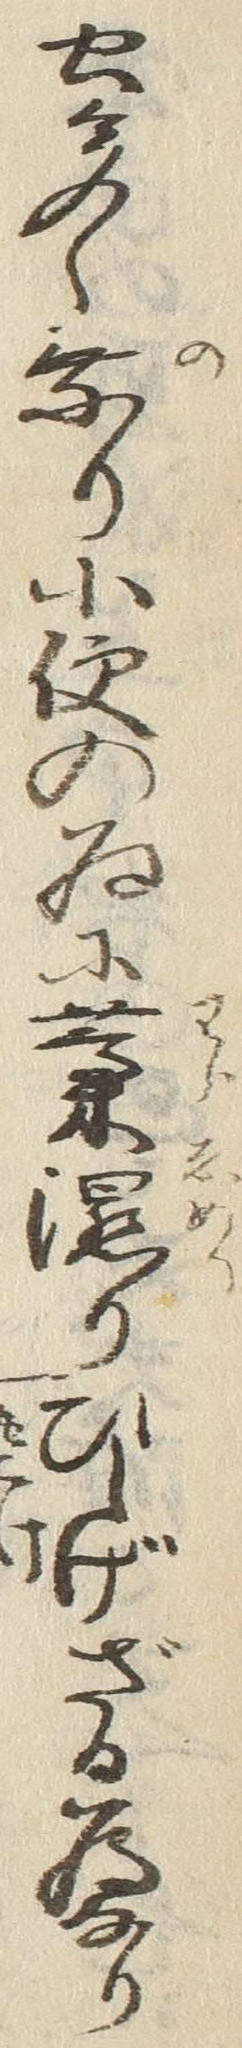虫多く乗り小便の為尓藁湿りひしげざる為なり
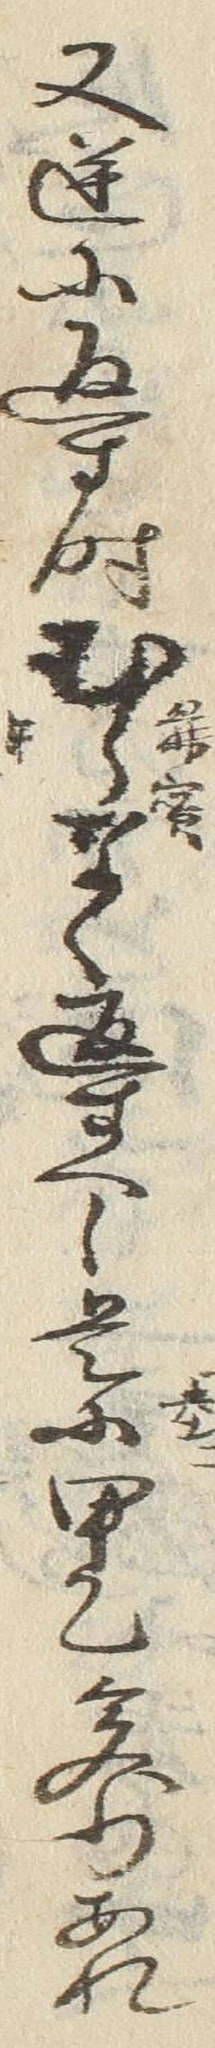又逆尓返す時むらなく返すへし是尓甲乙多少あれ
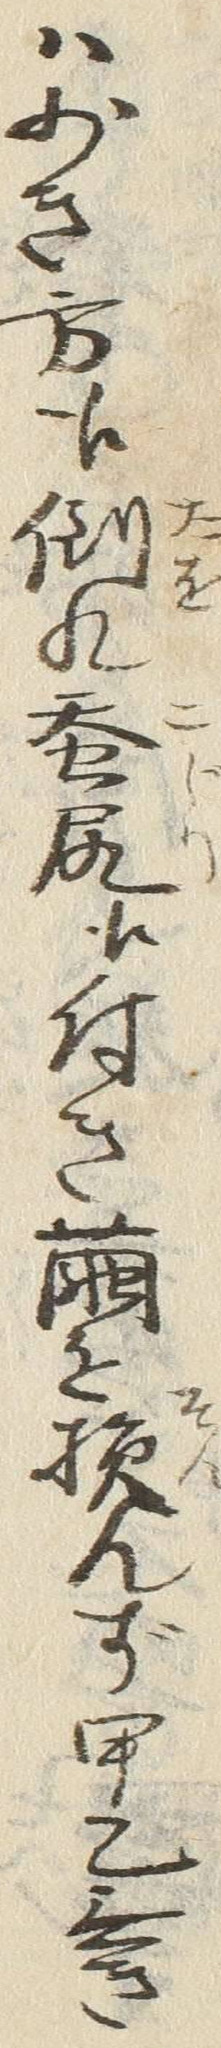は少き方江倒れ蚕尻江付き繭を損んず甲乙無き
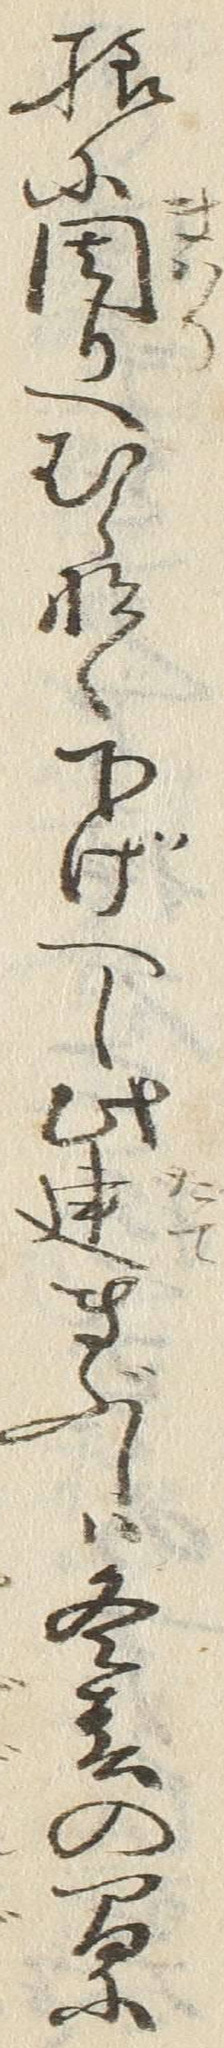様尓周りへむら那く下げへし此建まぶしは冬春の間尓
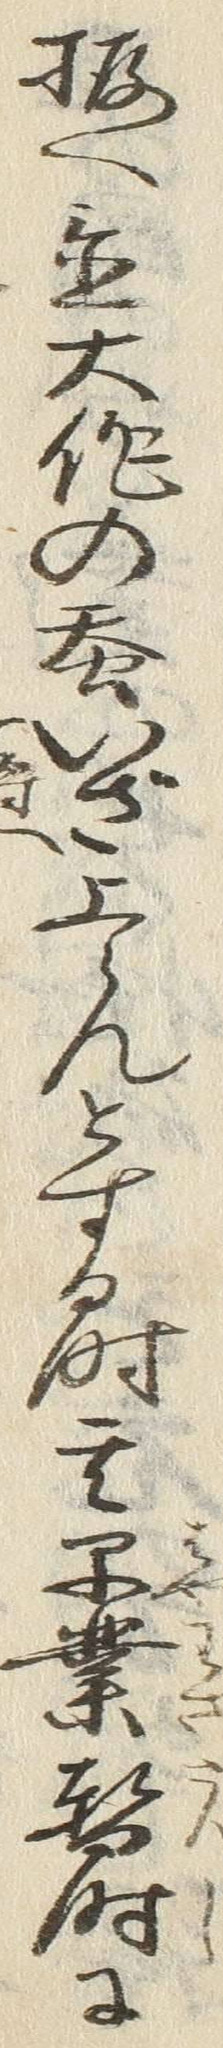拵へ置大作の蚕いざ上らんとする時其早業暫時尓
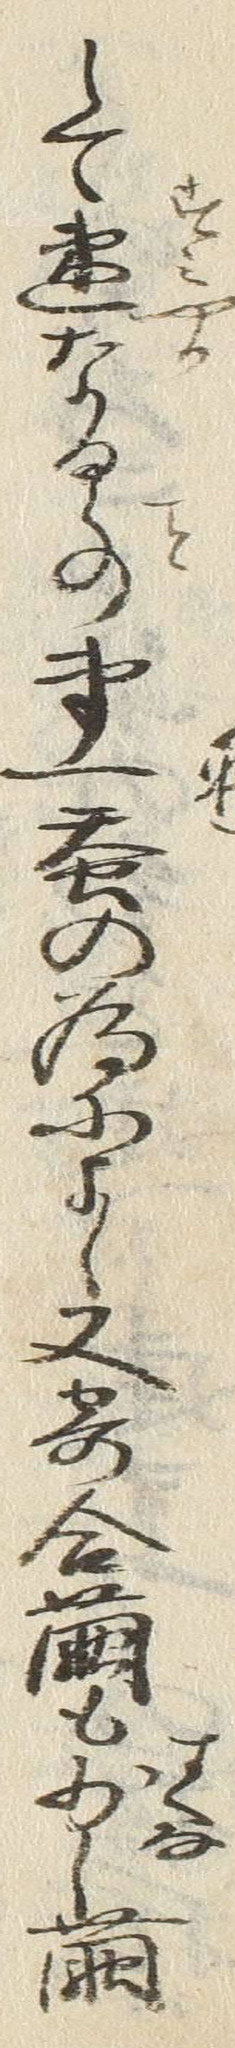して速なる事第一蚕の為尓よし又寄合繭も少し繭
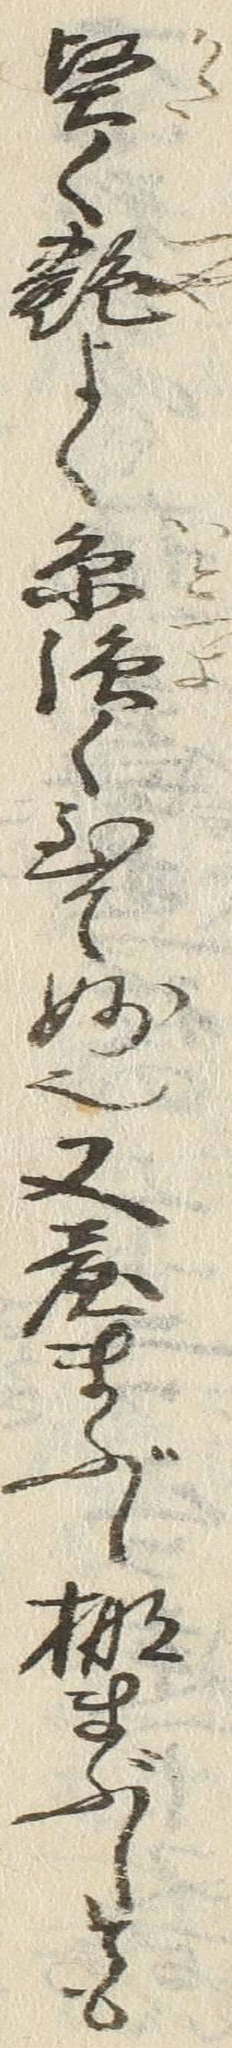堅く艶よく糸強く至て妙也又臺まぶし棚まぶしとも
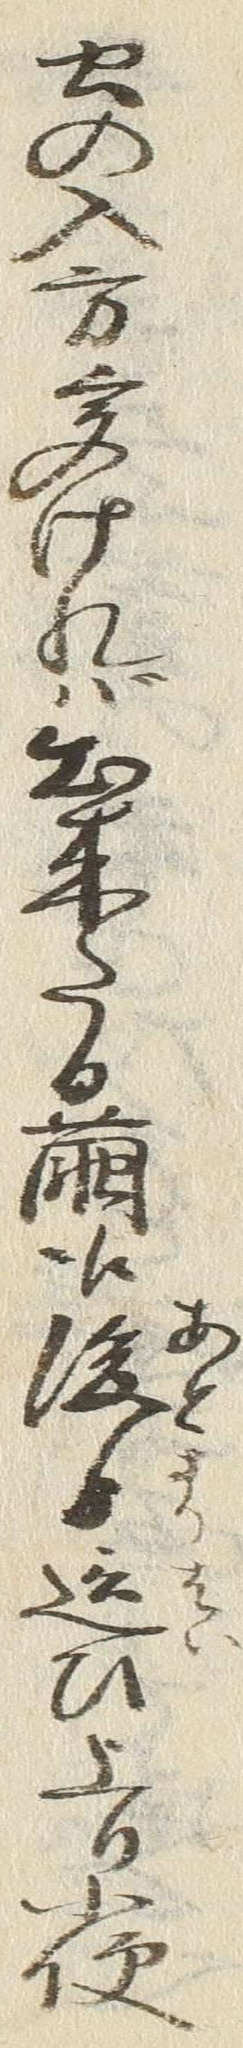虫の入方多ければ出来たる繭江後ゟ這ひ上り小便
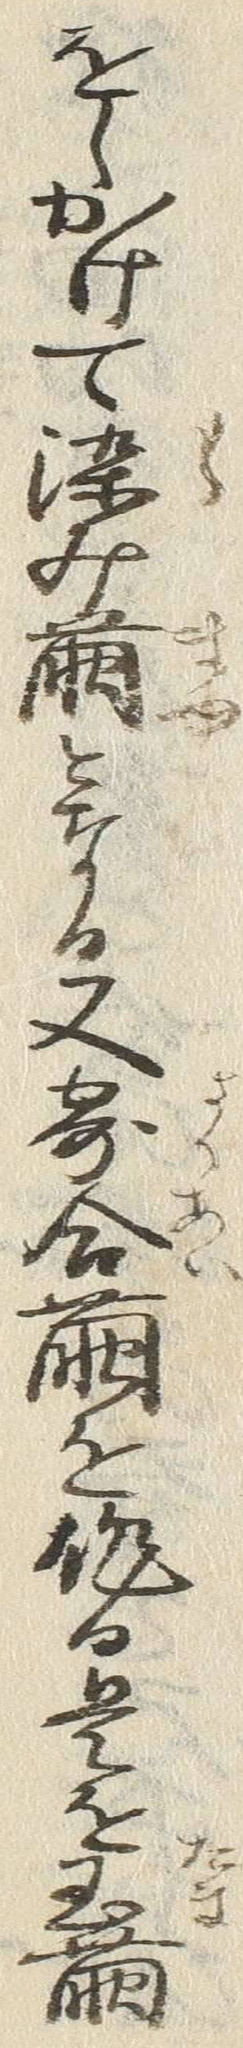をしかけて染み繭となる又寄合繭を作る是を玉繭
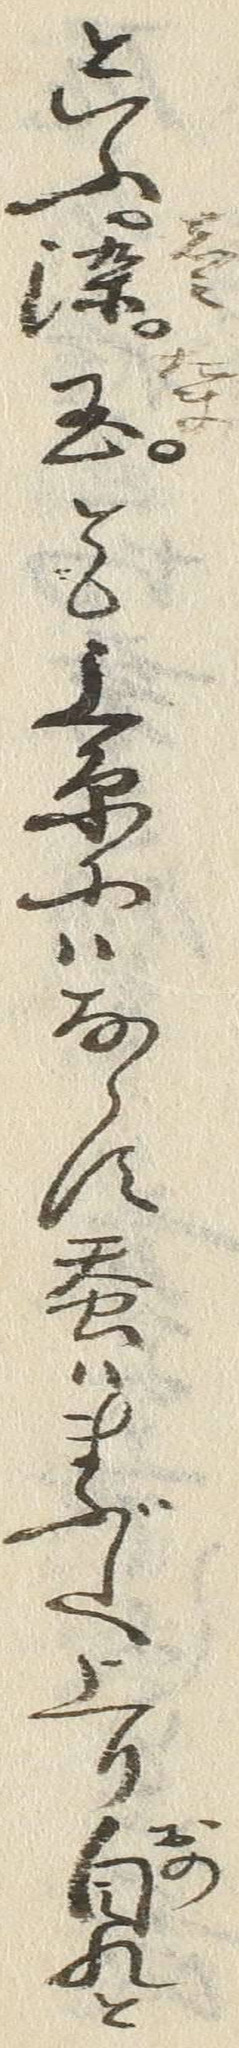といふ。染。玉。とも上糸尓はなら須蚕はまぶしへ上り自れと
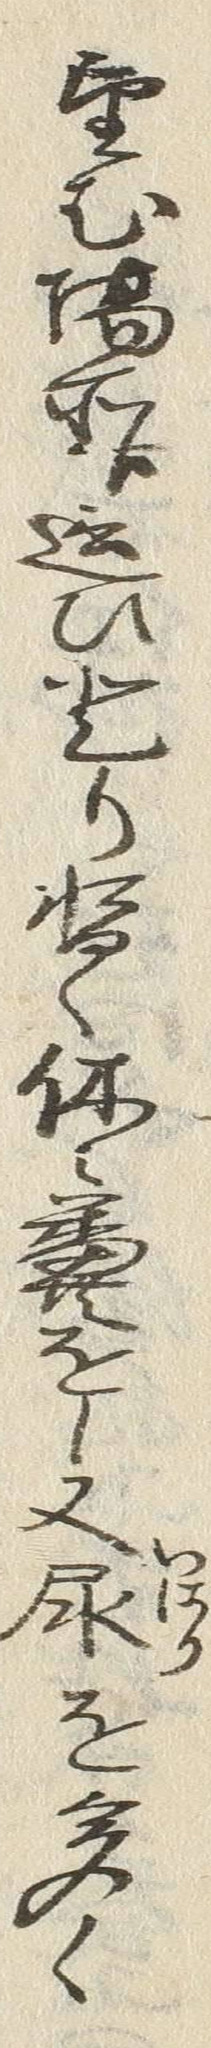望む場所這ひ登り暫く休み糞をし又尿を多く

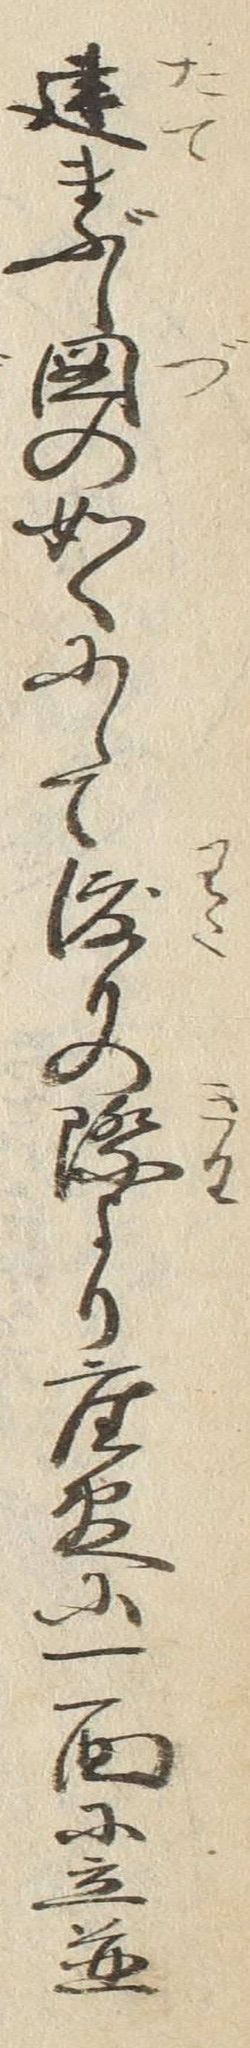建まぶし図の如く尓して渡りの際より座敷尓一面尓立並
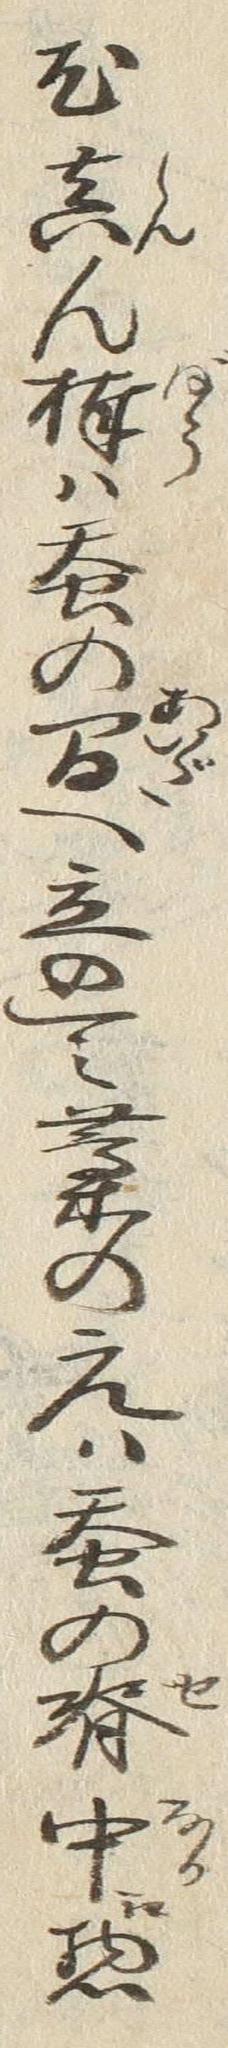尤真ん棒は蚕の間へ立込み藁の元は背中江惣
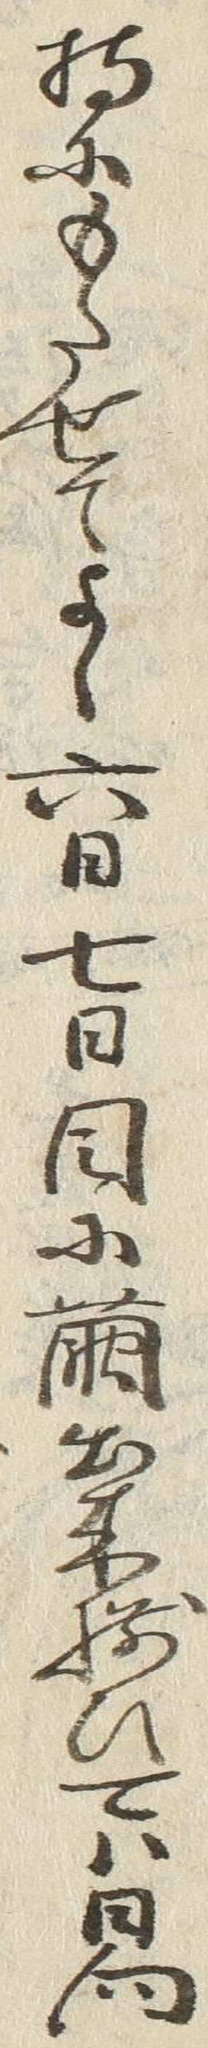持尓もたせてよく六日七日目尓繭出来揃ひては日向
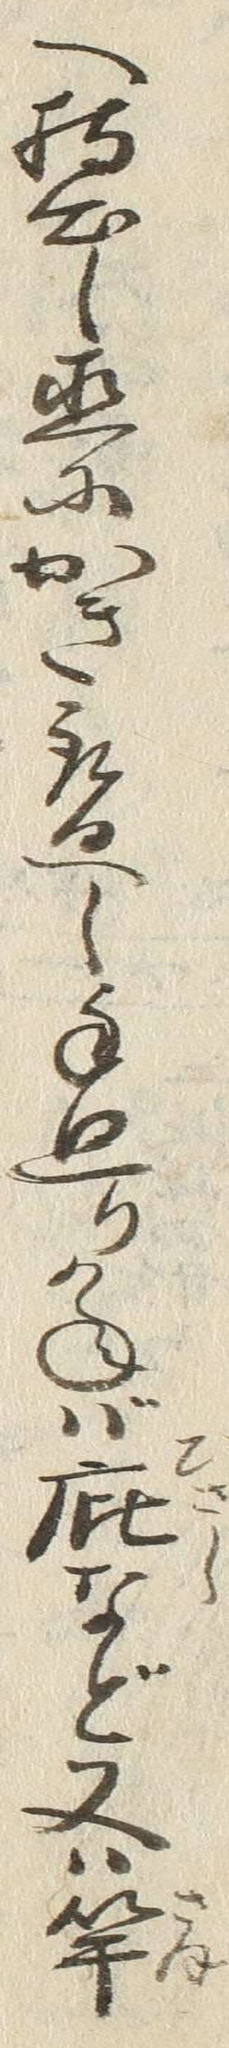へ持出し直尓かき取るへし手廻りか年ば庇など又は竿
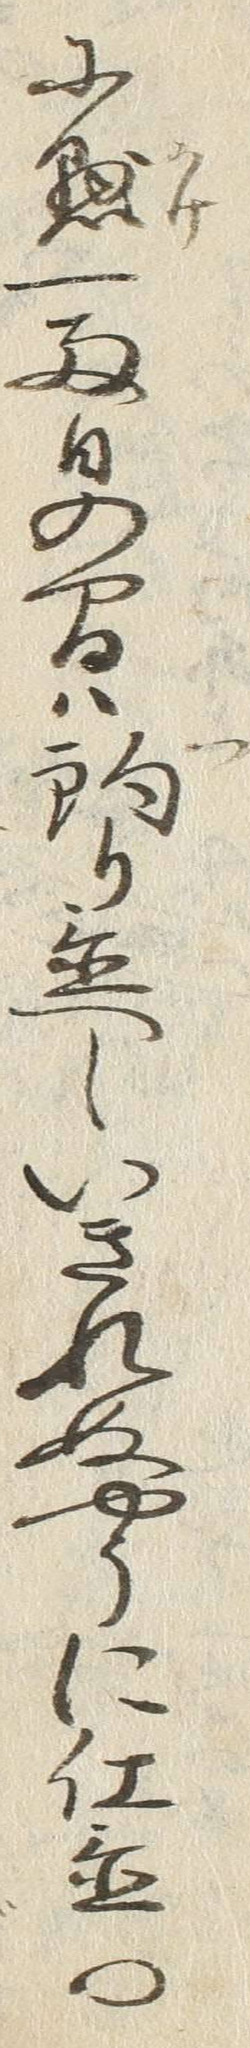尓懸一両日の間は釣り置へしいきれぬやうに仕置〇
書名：養蠶實驗録後編
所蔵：東京大学農学生命科学図書館 国文学研究資料館
